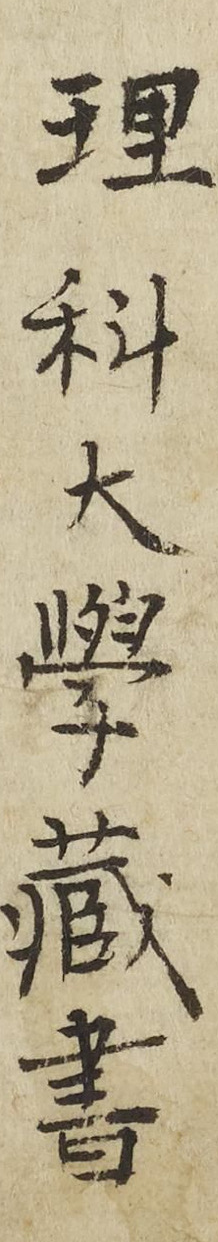理科大学蔵書
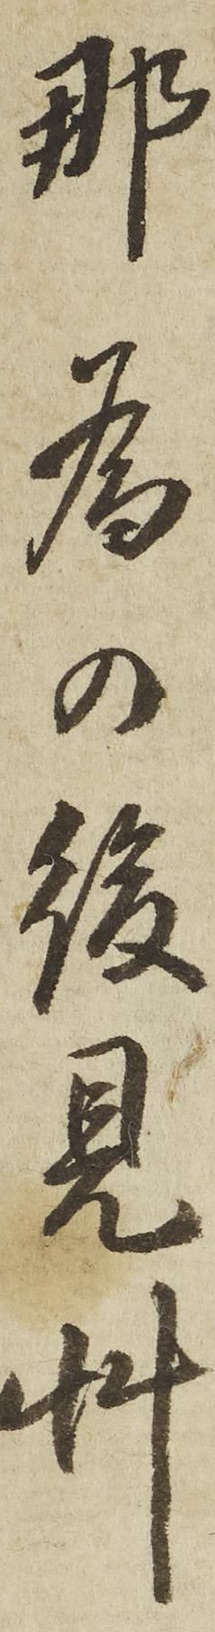那為の後見艸全

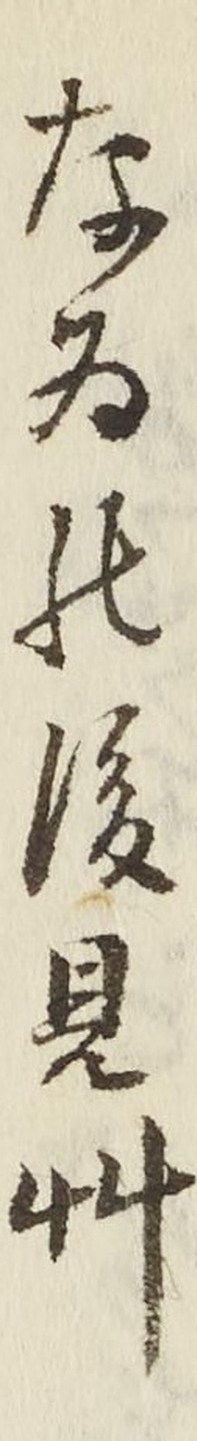なゐの後見艸
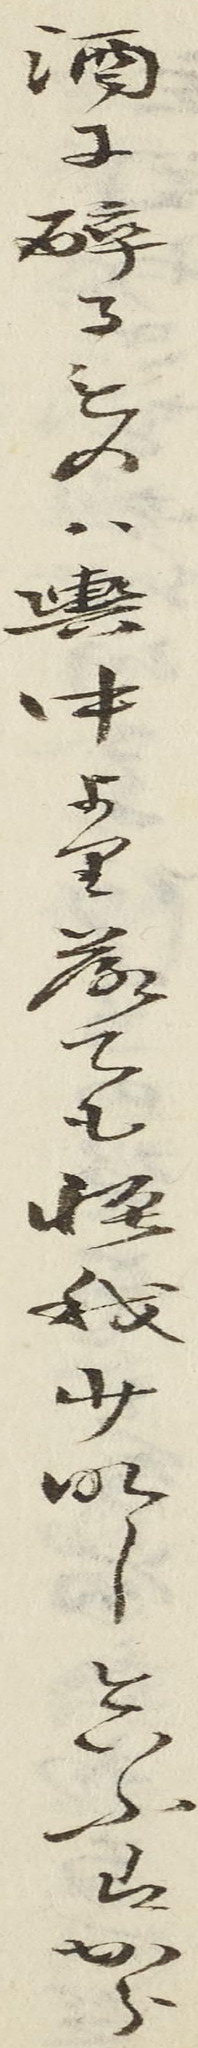酒に酔るものハ輿中より落ても怪我少なしといふはから
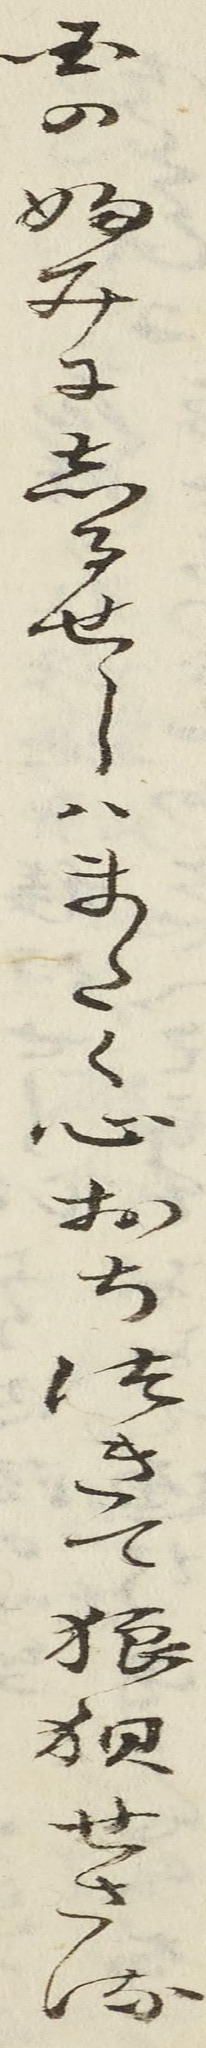国のふみにしるせしハまたく心おちつきて狼狽せさる
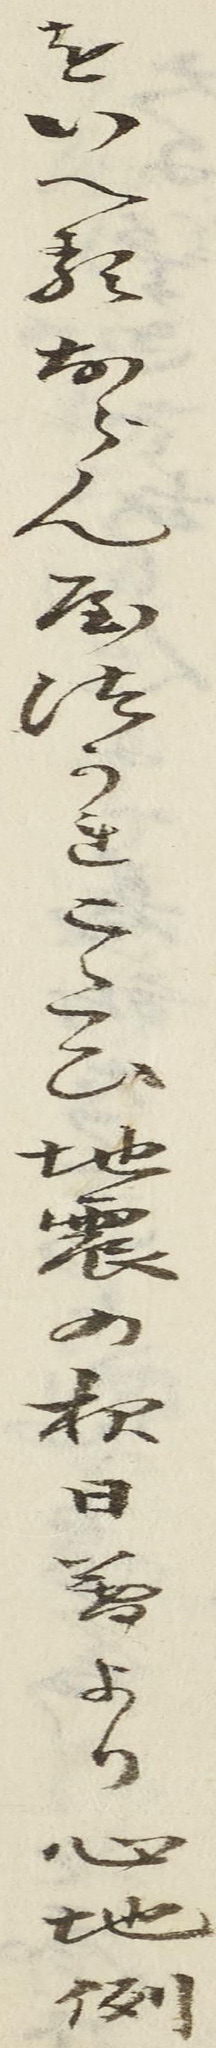をいへるならんやつかれこたひ地震の夜日暮より心地例
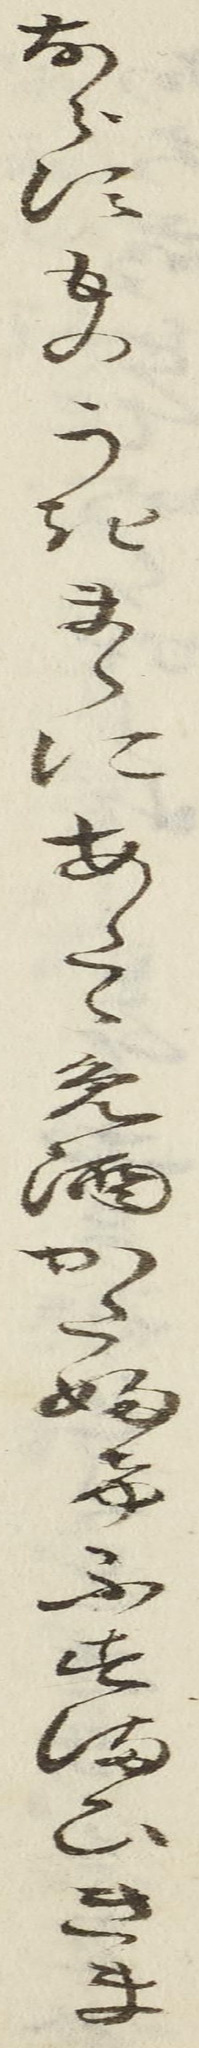ならすものうきまゝにあたゝめ酒かたふきふすまひきま
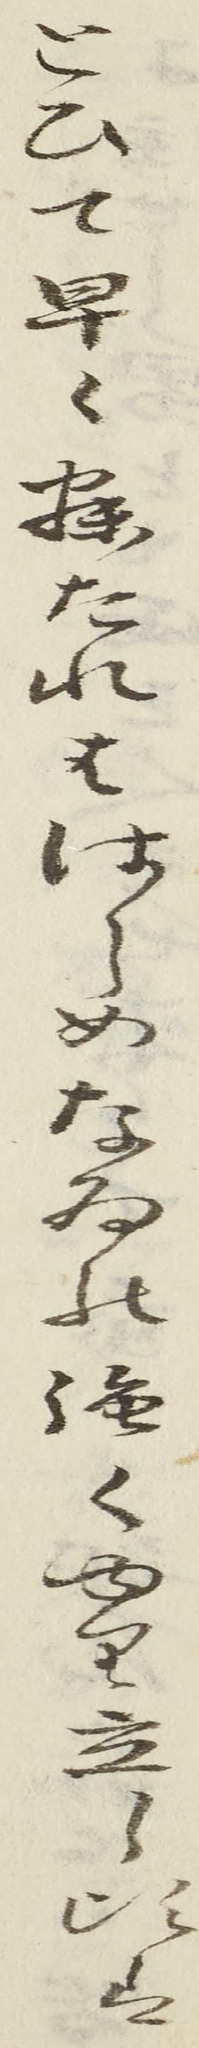とひて早く寝たれははしめなゐの強くゆり立し頃は
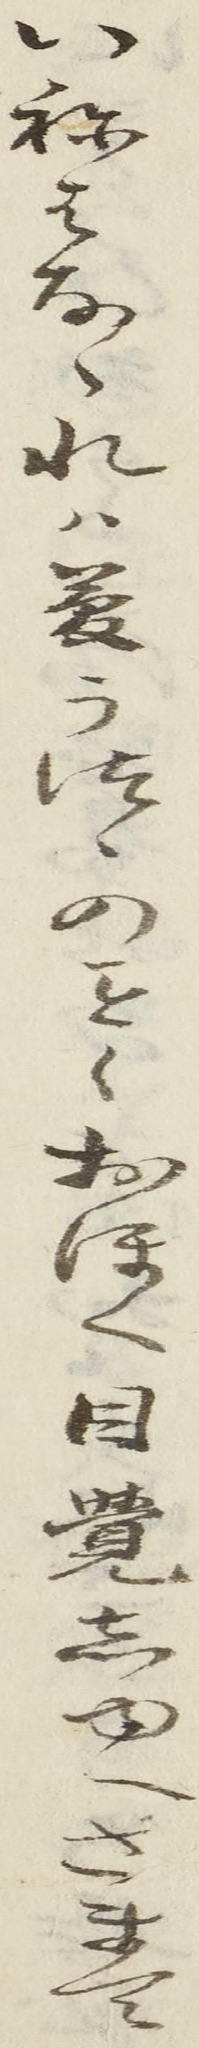いねはなくれは夢うつゝのことくおほへ目覚しゆへさまて
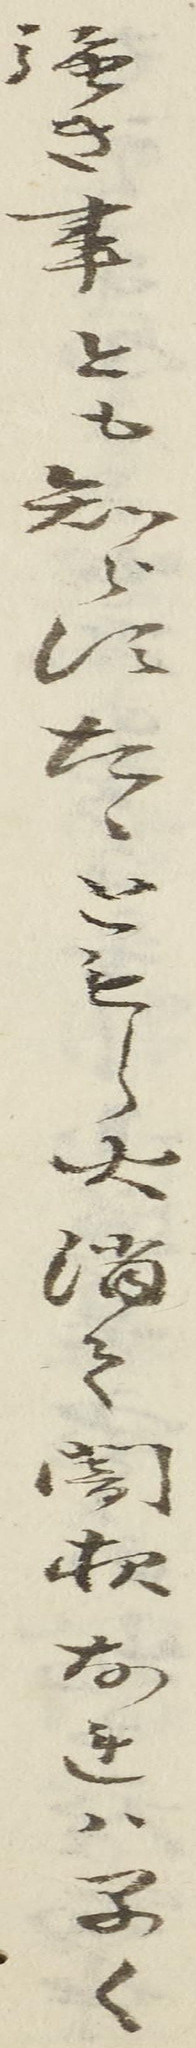強き事とも知らすたゝともし火消て闇夜なれは早く
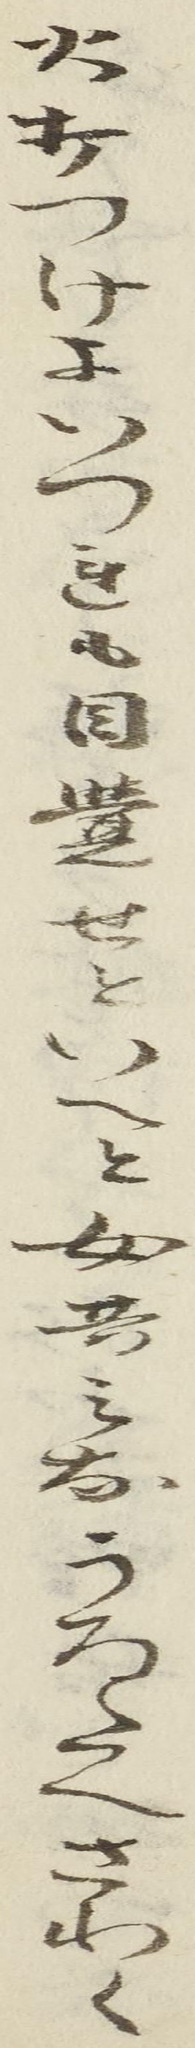火打つけよいつれも目覚せといへと女共ミなうろたへさわく
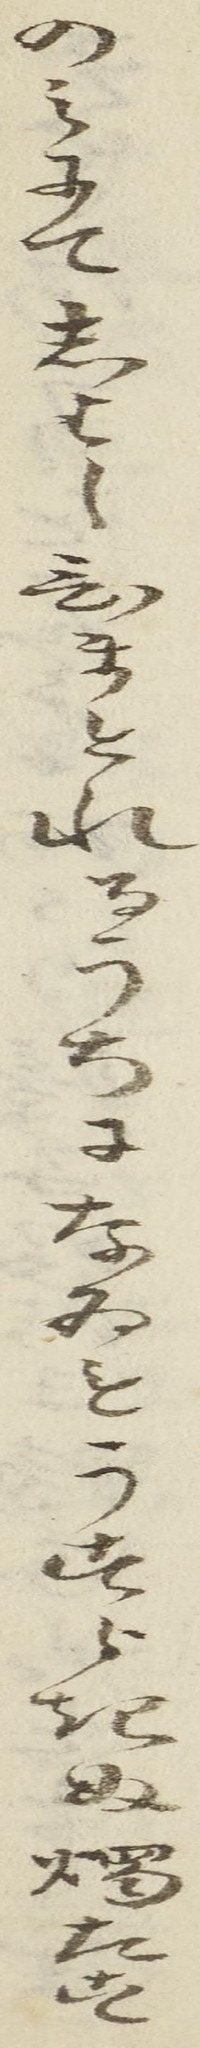のミにてしはしひまとれるうちになゐもうすらきぬ燭たす

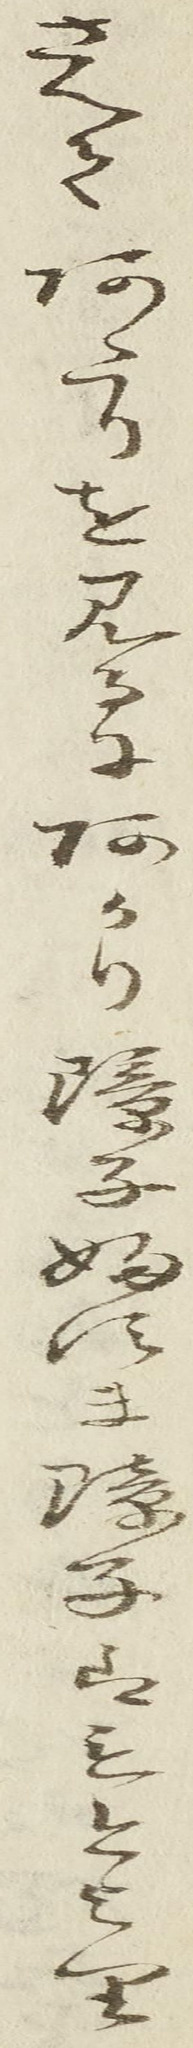さへてあたりを見るにあかり障子ふすま障子はもとより
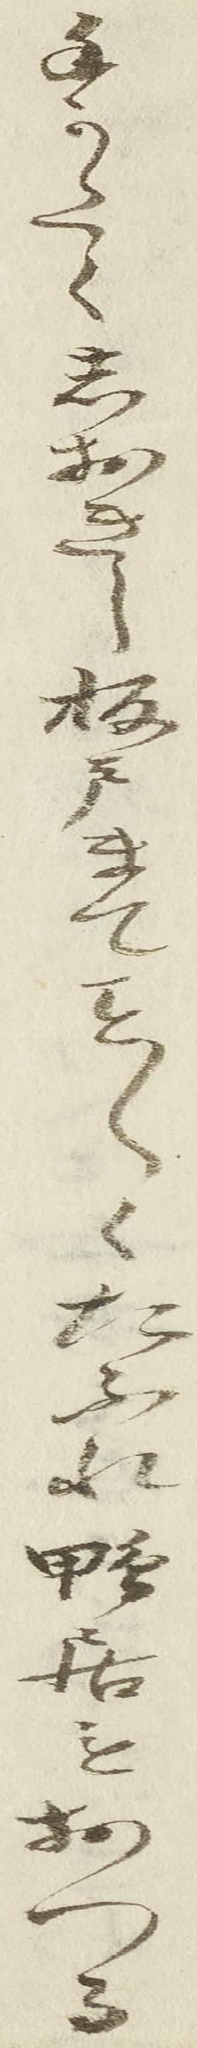手かたくしおきし板戸まてこと〳〵くたふれ鴨居もおつる
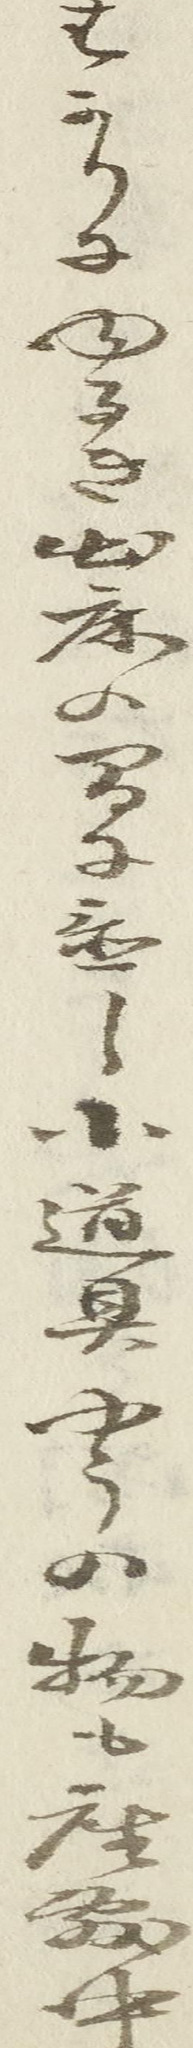はかりにゆるき出床の間に置し小道具やうの物も座敷中
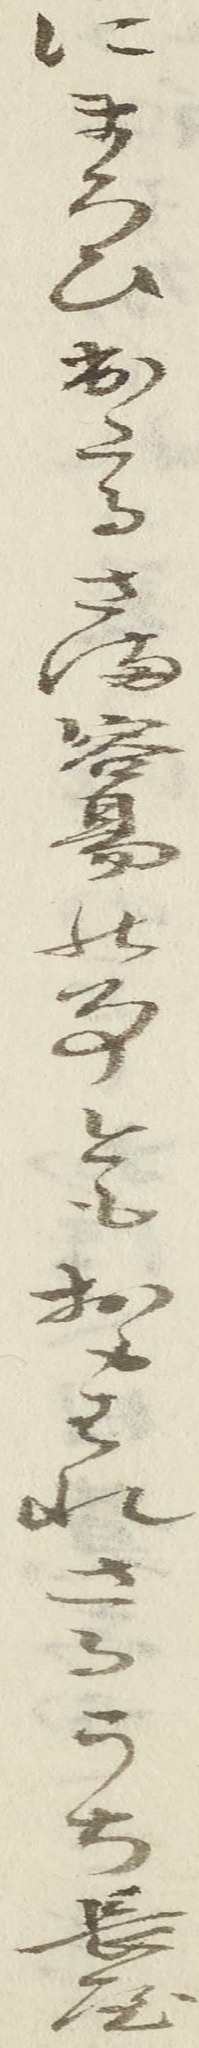にまろひ出たるさま容易の事ともおもわれさるうち長屋
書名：那為の後見艸　全
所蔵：東京大学地震研究所図書室 Earthquake Research Institute Library, The University of Tokyo, JAPAN
